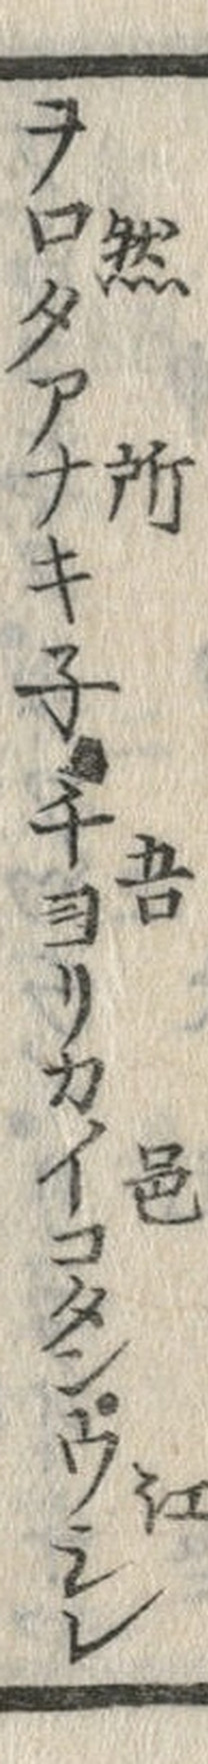ヲロタアナキネ。チヨリカイコタン。ウシレ
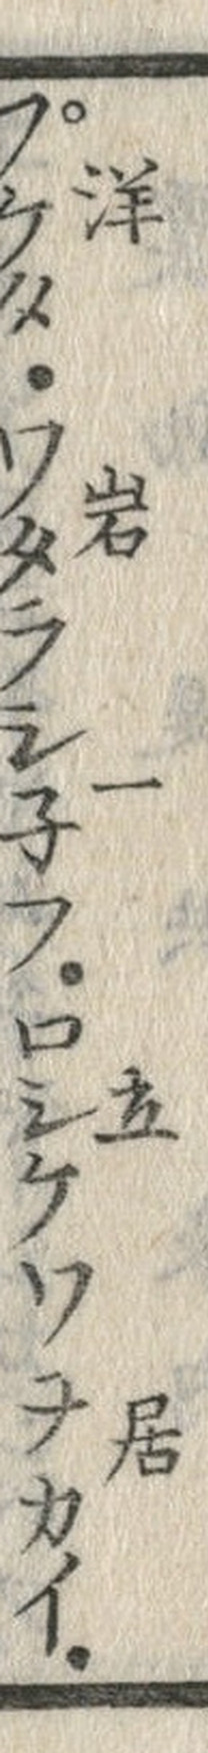プケタ。ワタラシネフ。ロシケワヲカイ。
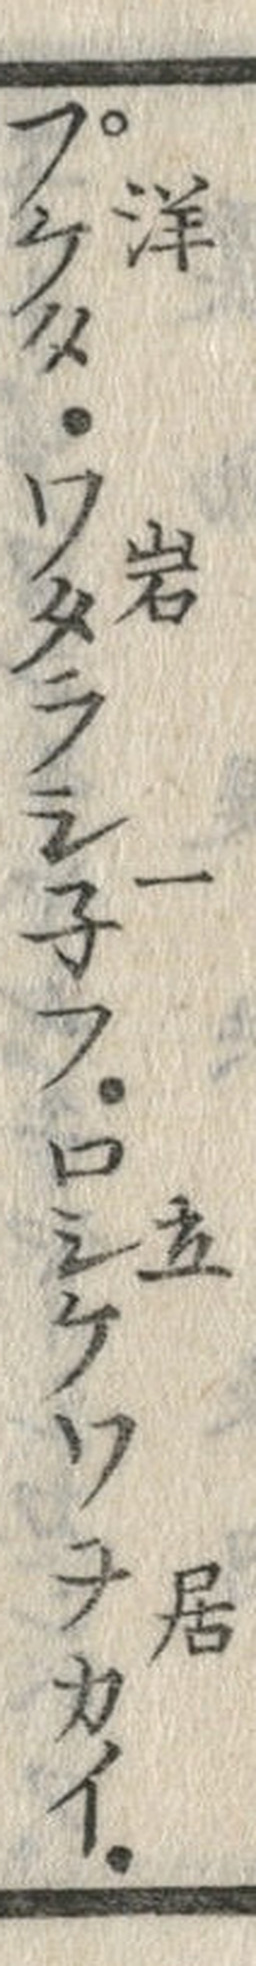プケタ。ワタラシネフ。ロシケワヲカイ。
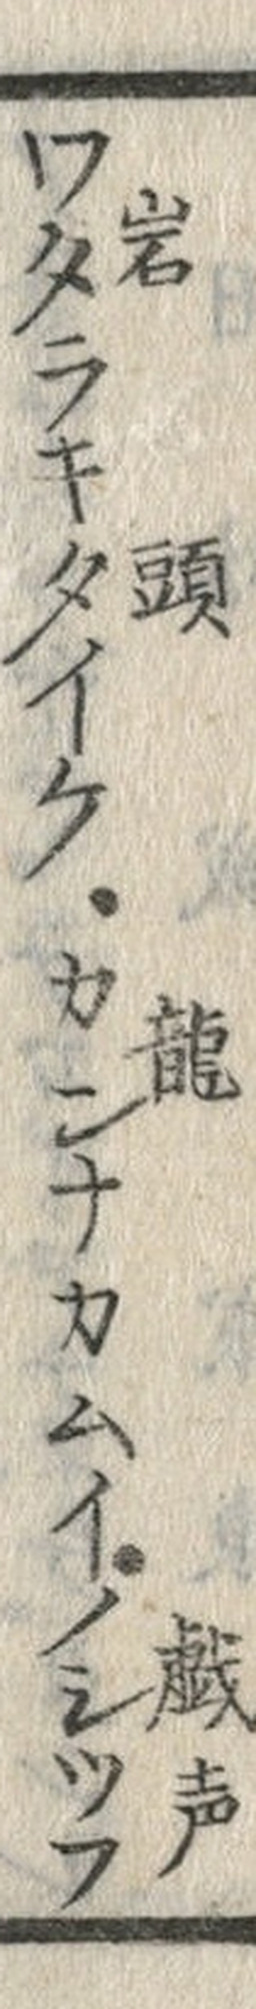ワタラキタイケ。カンナカムイ。ノシツフ
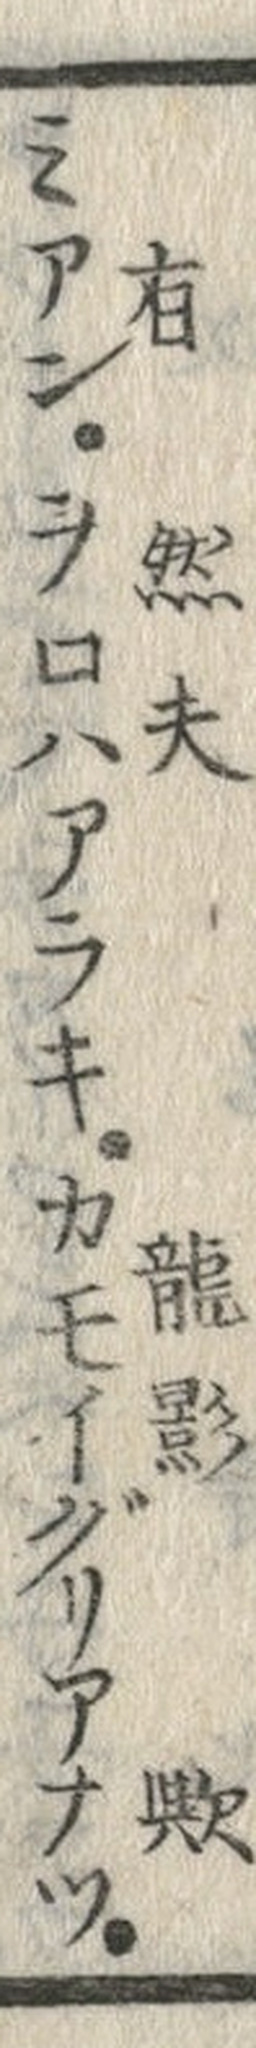ミアン。ヲロハアラキ。カモイグリアナツ。
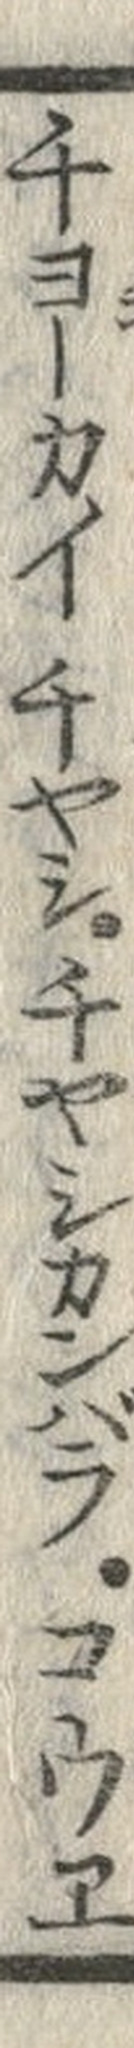チヨーカイチヤシ。チヤシカンバラ。コウヱ

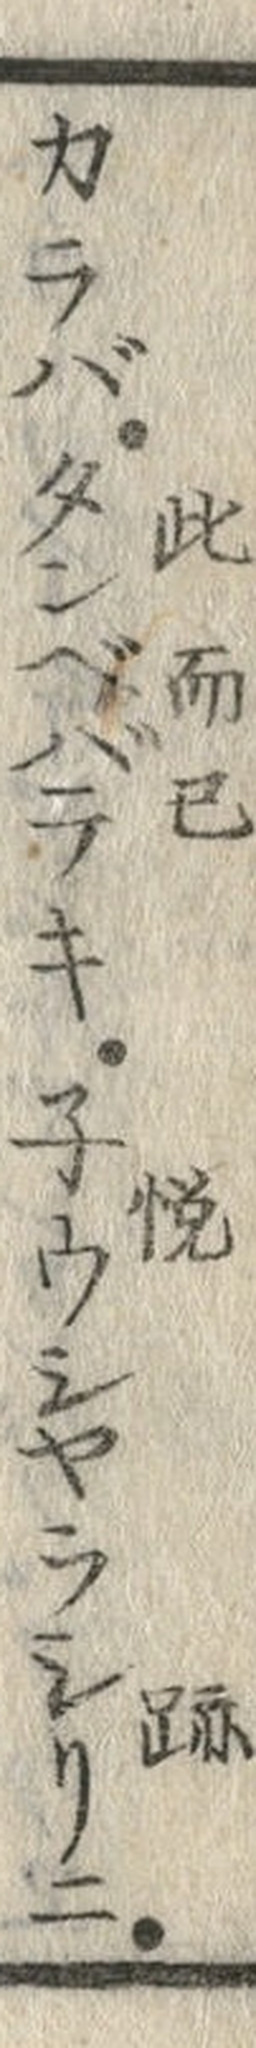カラバ。タンベバテキ。ネウシヤラシリニ。
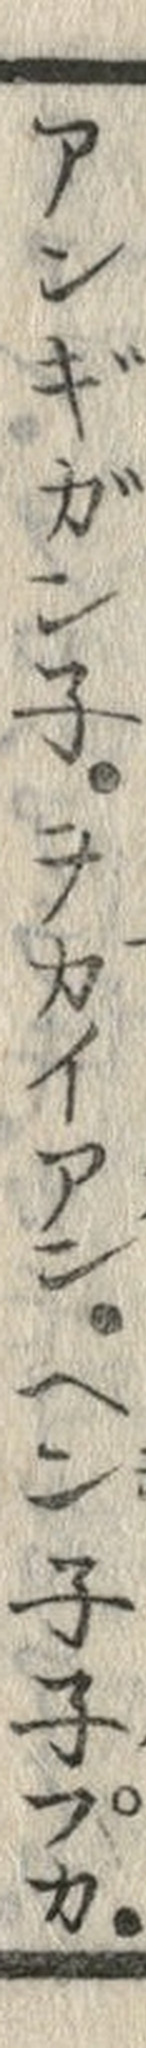アンギガン子。ヲカイアン。ヘンネネプカ。
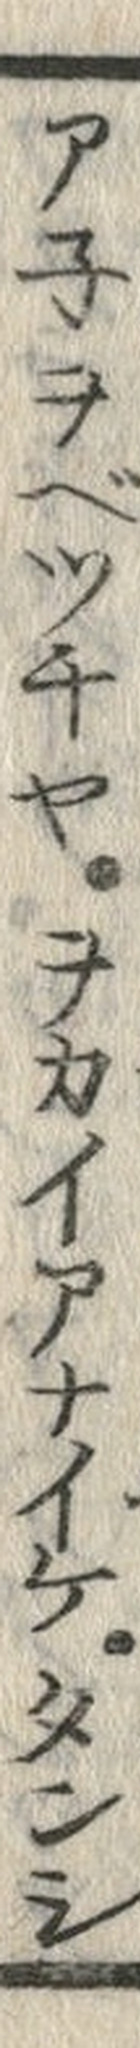アネヲベツチヤ。ヲカイアナイケタンシ
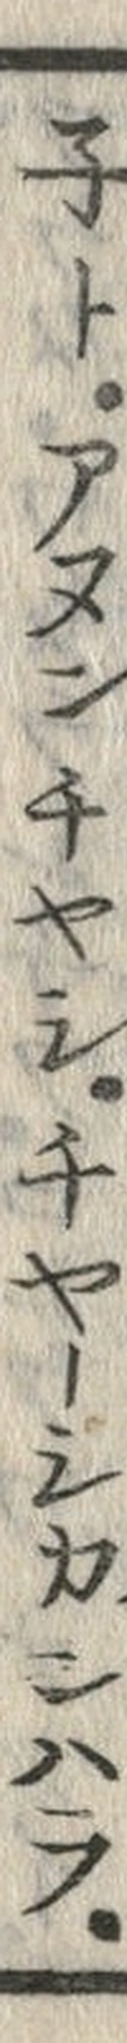ネト。アヌンチヤシ。チヤーシカンハラ。
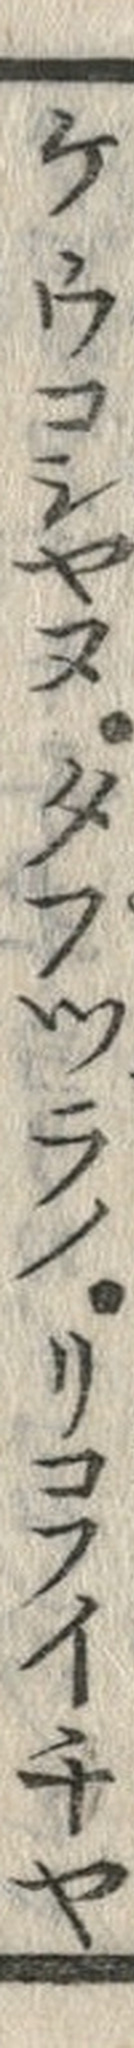ケウコシヤヌ。タプツラノ。リコフイチヤ
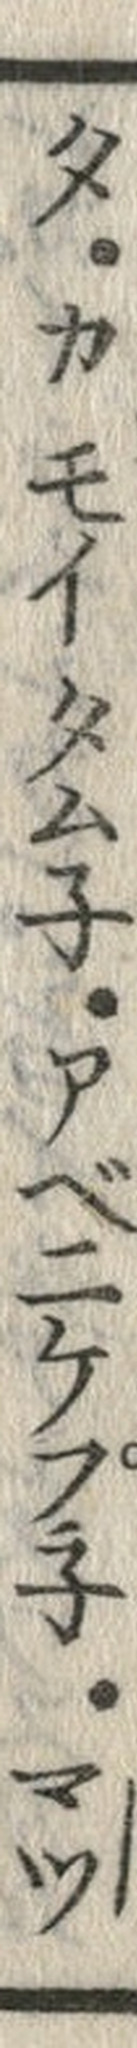タ。カモイタムネ。アベニケプネ。マツ
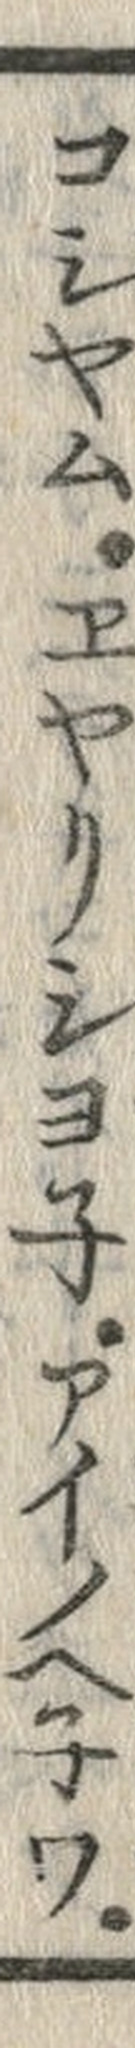コシヤム。ヱヤリシヨネ。アイノヘネワ。
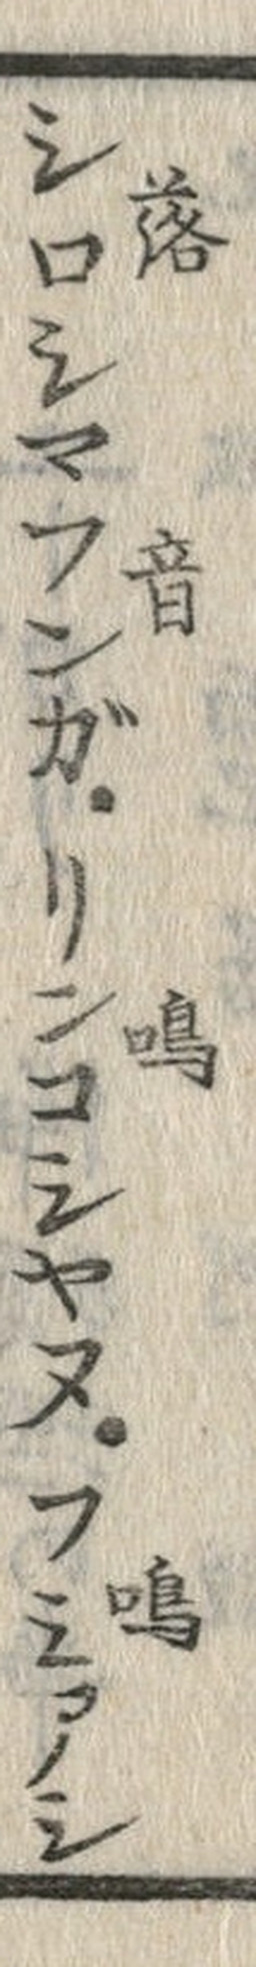シロシマフンガ。リンコシヤヌ。フミアシ

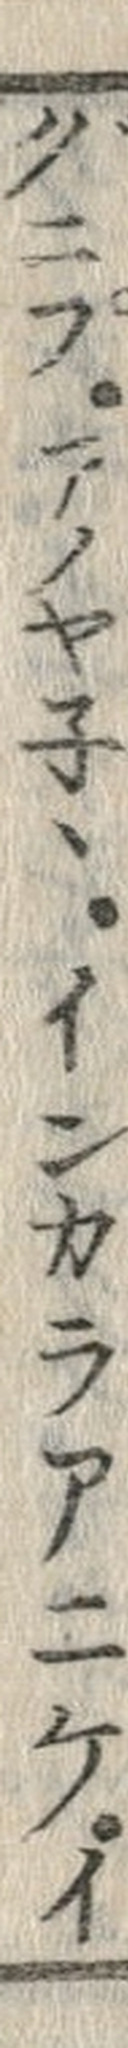グニプ。アノヤネヽ。インカラアニケ。イ
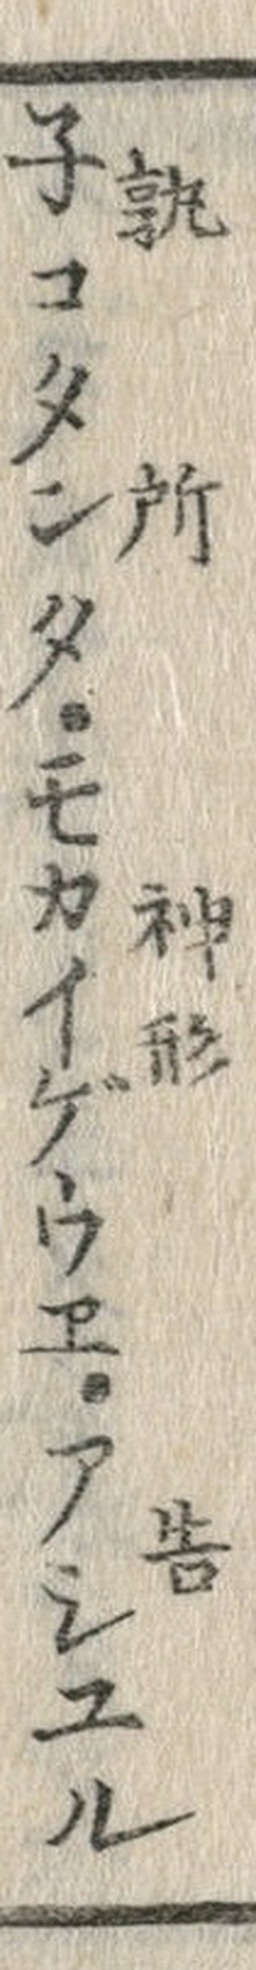ネコタンタ。モカイゲウヱ。アシユル
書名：蝦夷方言藻汐草　坤巻
